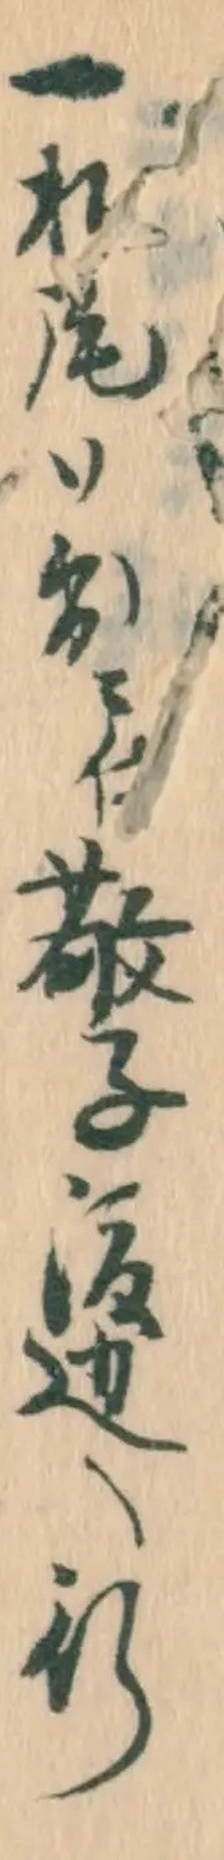一松尾御ニ付敬子渡辺へ行
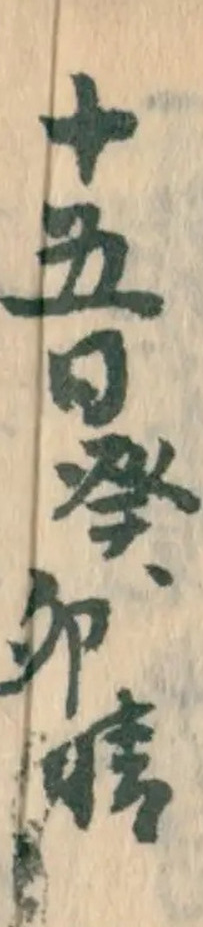十五日癸卯晴

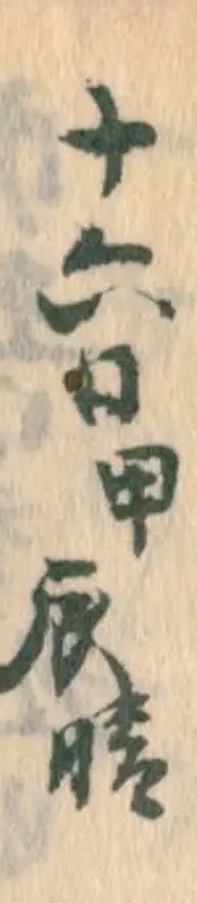十六日甲辰晴
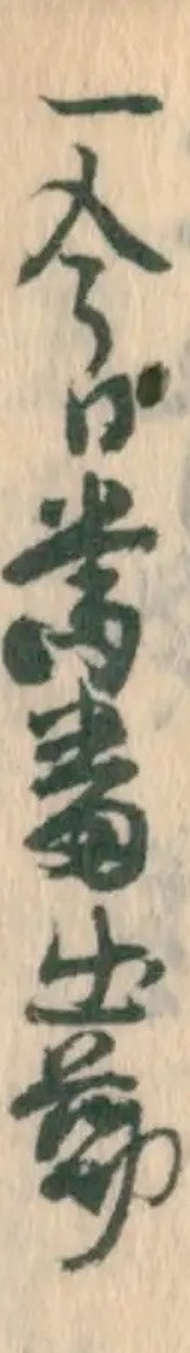一今日当番出勤
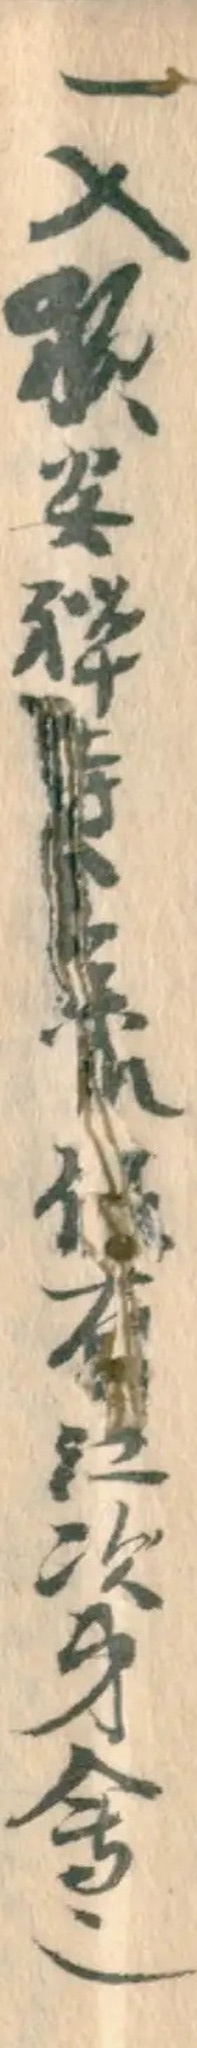一入夜安禅寺へ参ル依有江次第会也
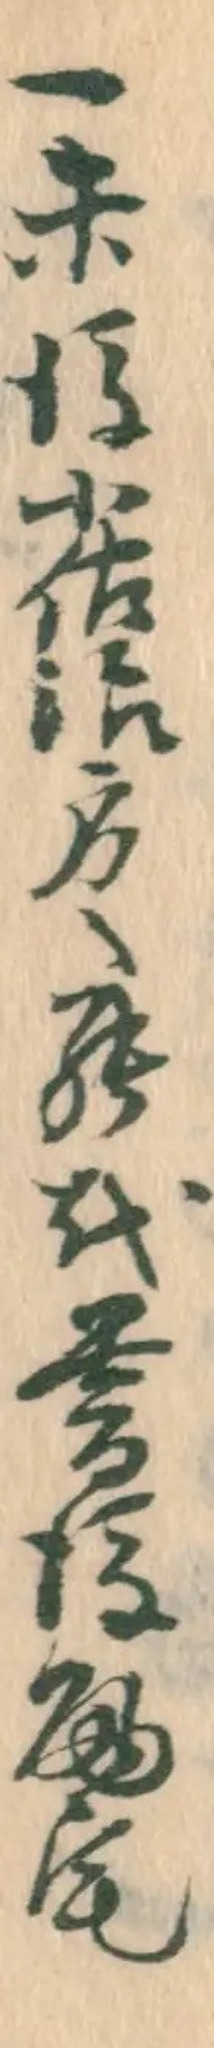一未後小佐治方へ罷越暮後帰宅
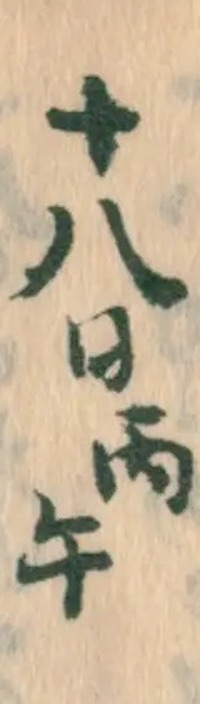十八日丙午
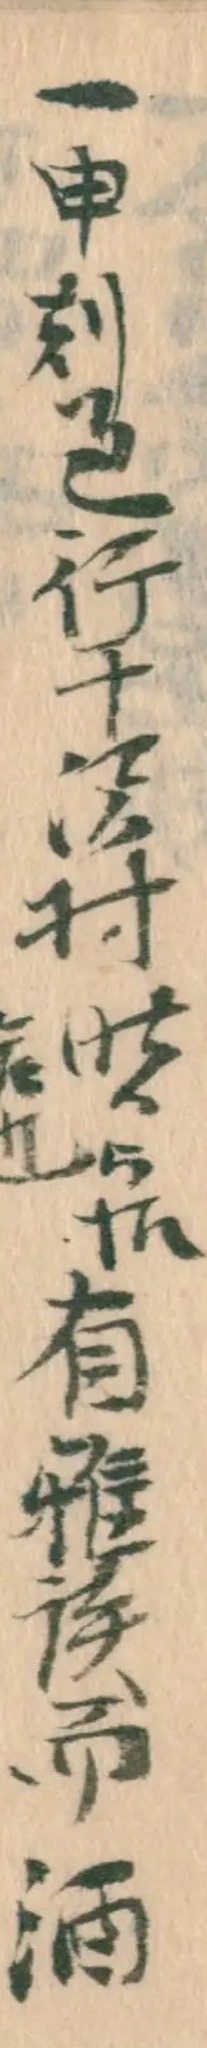一申刻過行十沢村昨日被招候也有雅談而
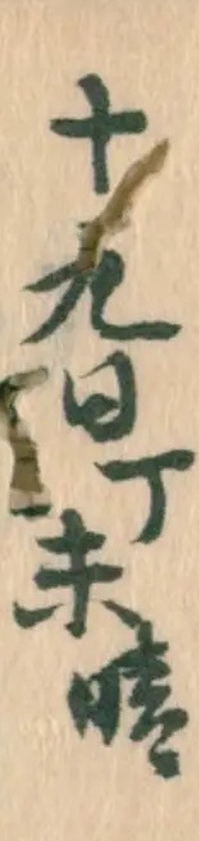十九日丁未晴
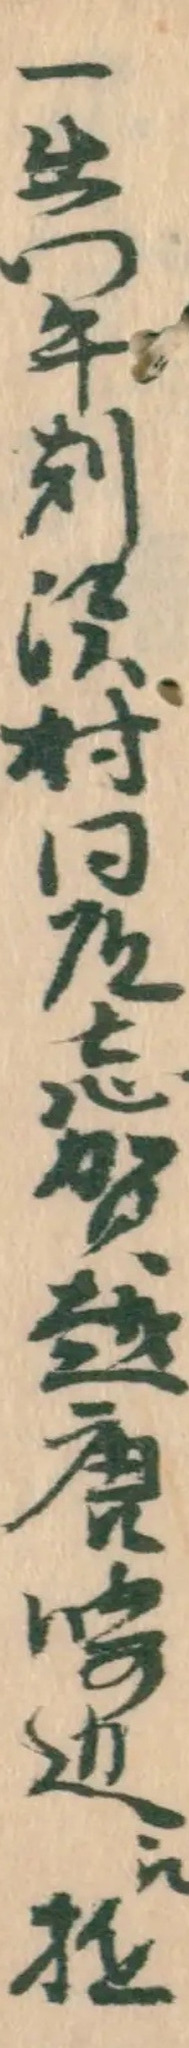一出門午刻沢村同道志賀越唐崎辺え遊
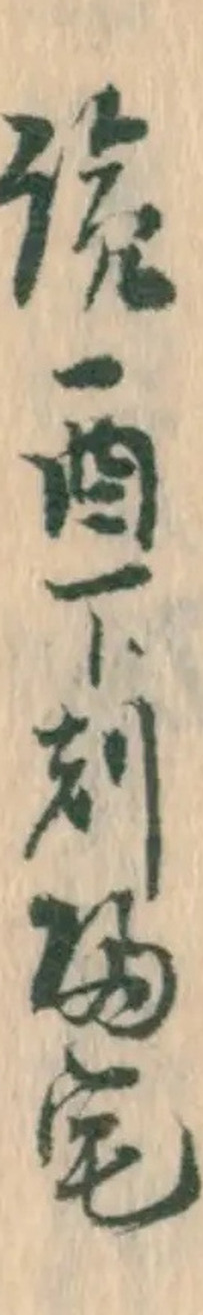覧酉下刻帰宅
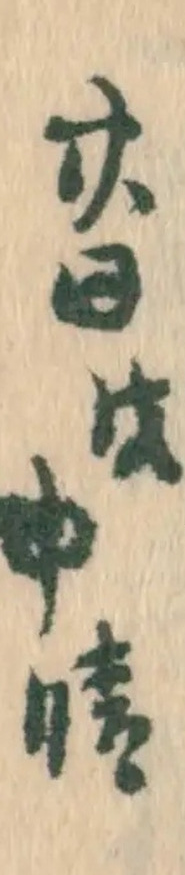廿日戊申晴
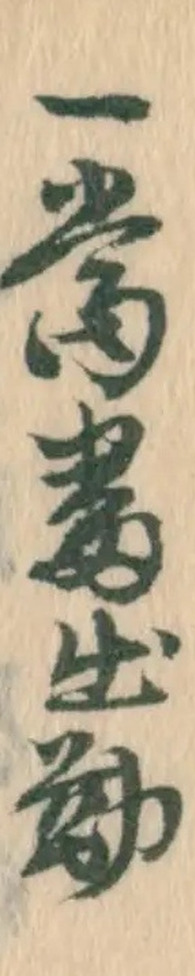一当番出勤

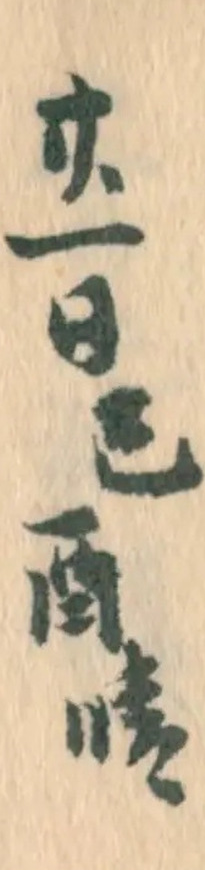廿一日己酉晴
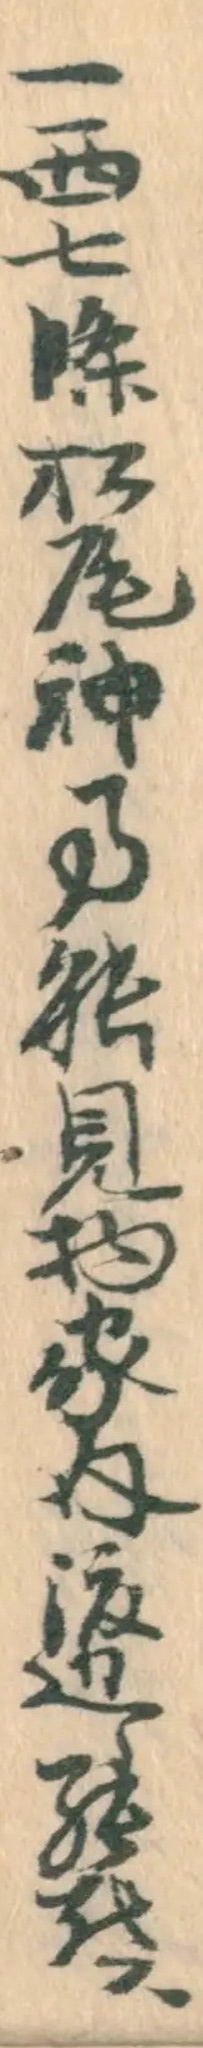一西七条松尾神事能見物家内渡辺へ罷越ス
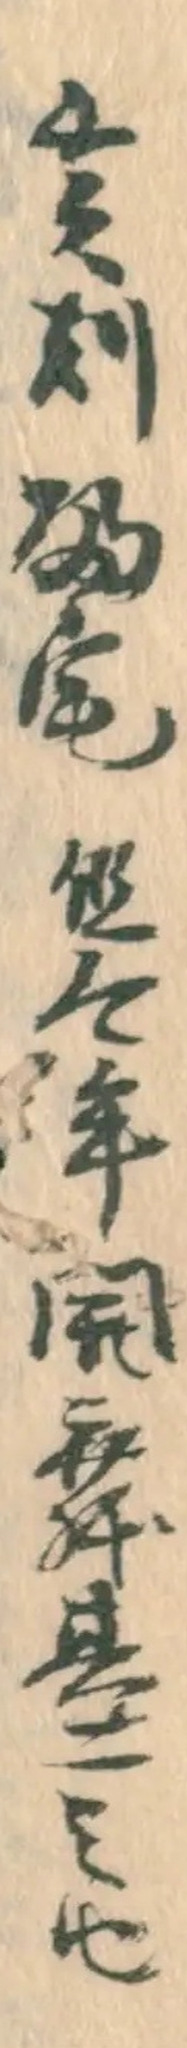亥刻帰宅但今年開舞基之由
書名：禁裏御所御用日記. [131]
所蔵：国立国会図書館 National Diet Library, JAPAN
